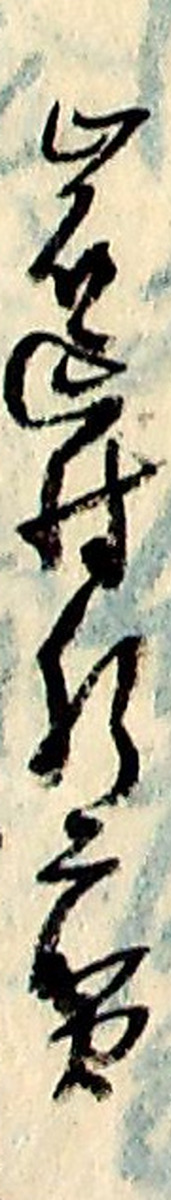岩延村肝煎
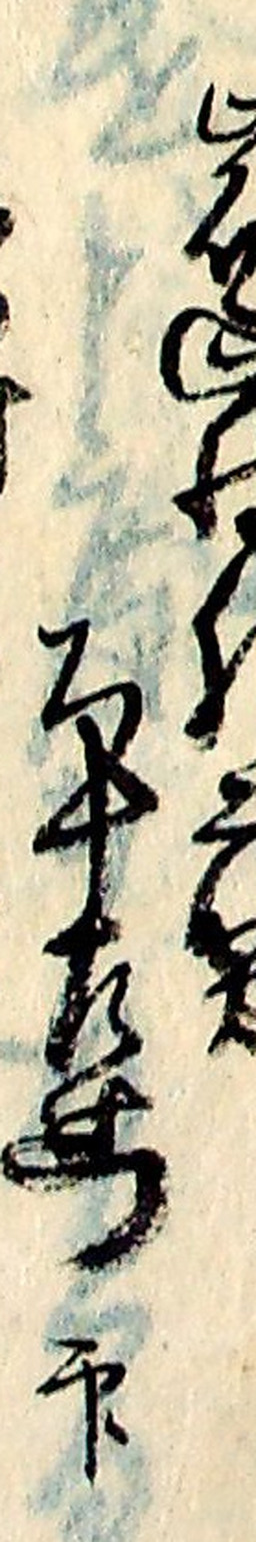平左衛門印
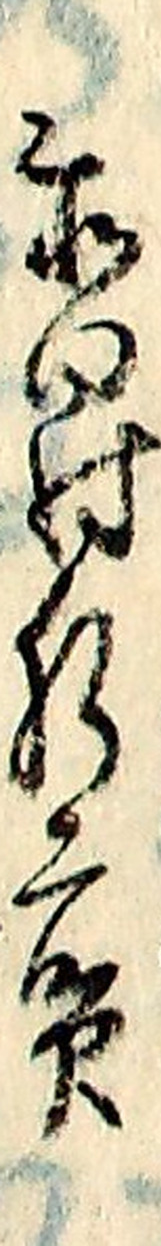和田村肝煎
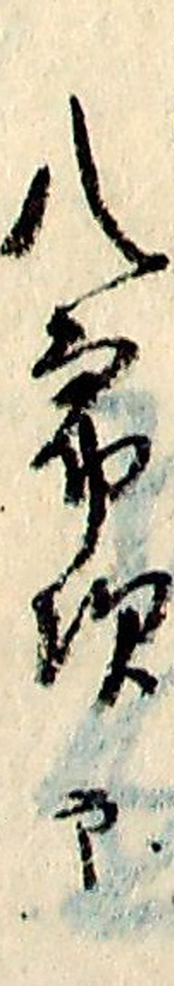八郎次印

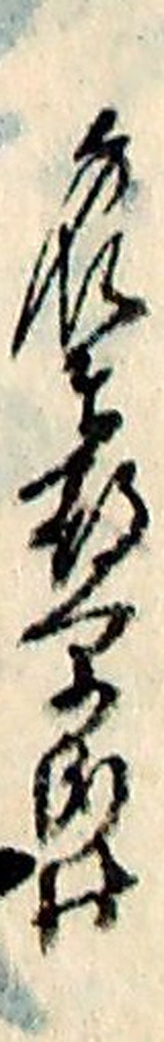名東郡早淵村
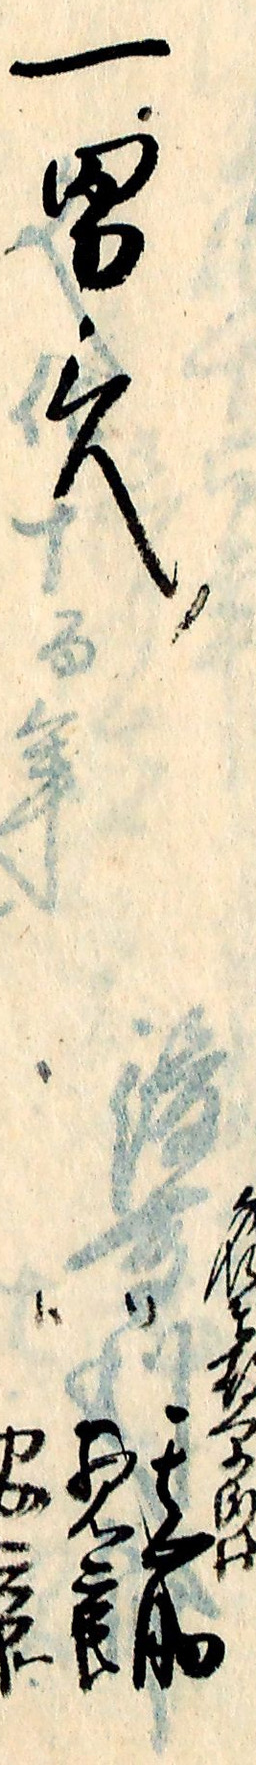一男三人甚助
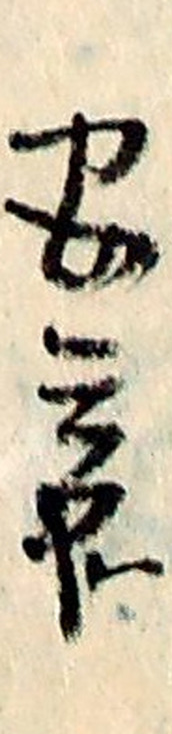安兵衛
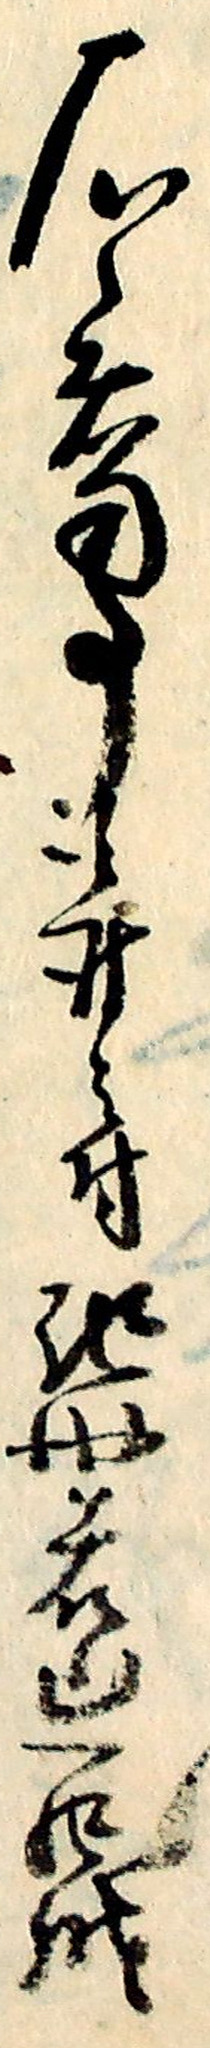右之者用事御座候に付紀州若山罷越
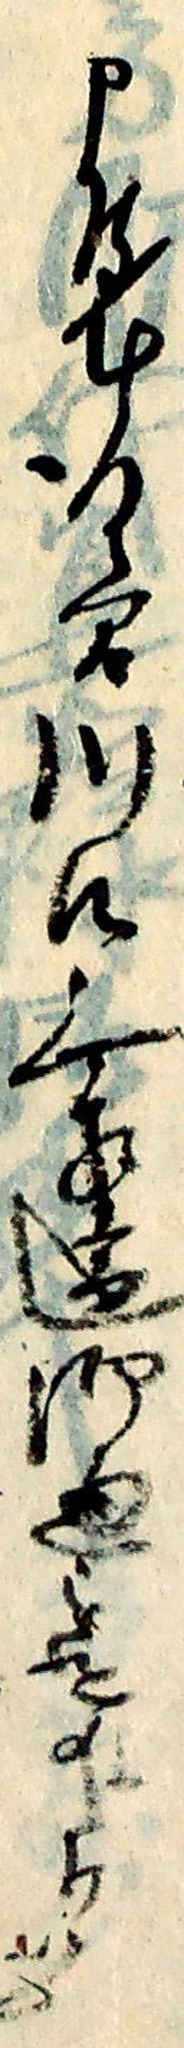申度奉存候間川口無相違御通被遊可被下候以上
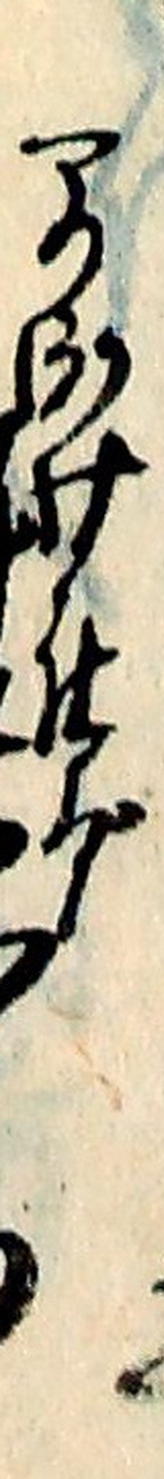早淵村庄屋
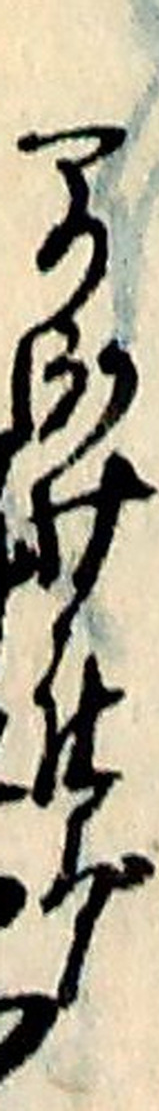早淵村庄屋
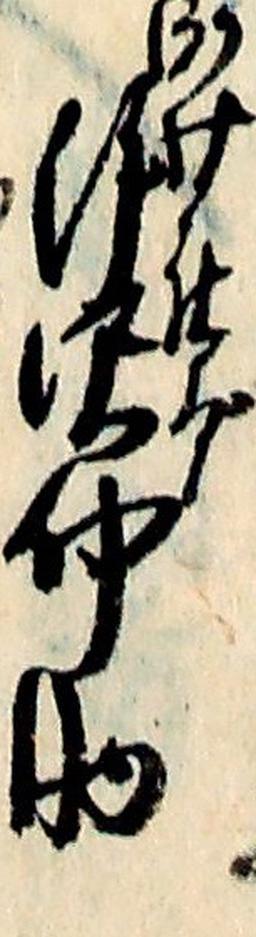伊沢仲助
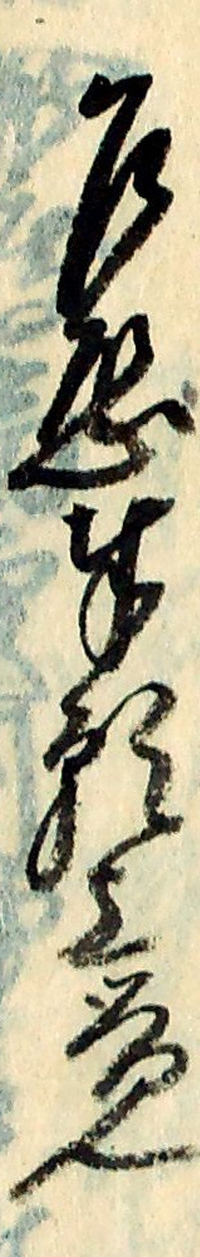乍恐奉願上覚
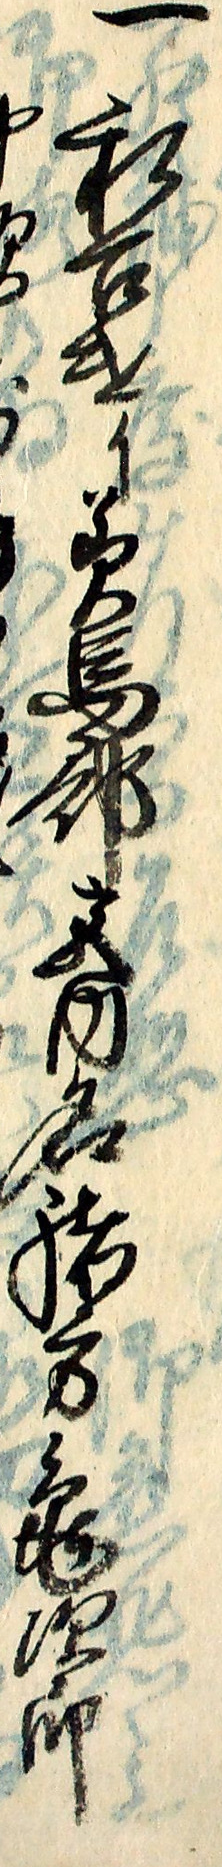一私召遣い美馬郡宮内名緒方亀次郎
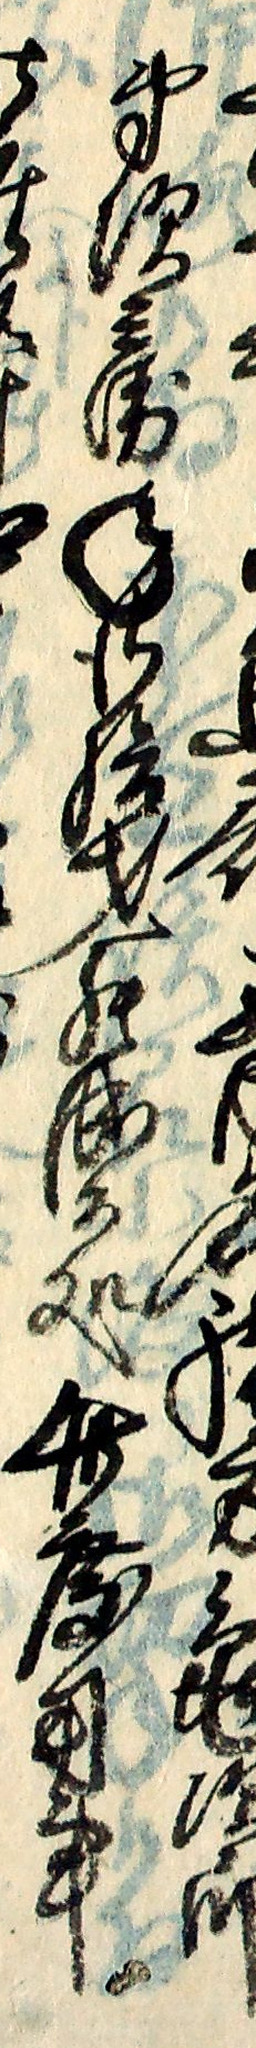弟次兵衛年弐拾才に罷成候処此度用事
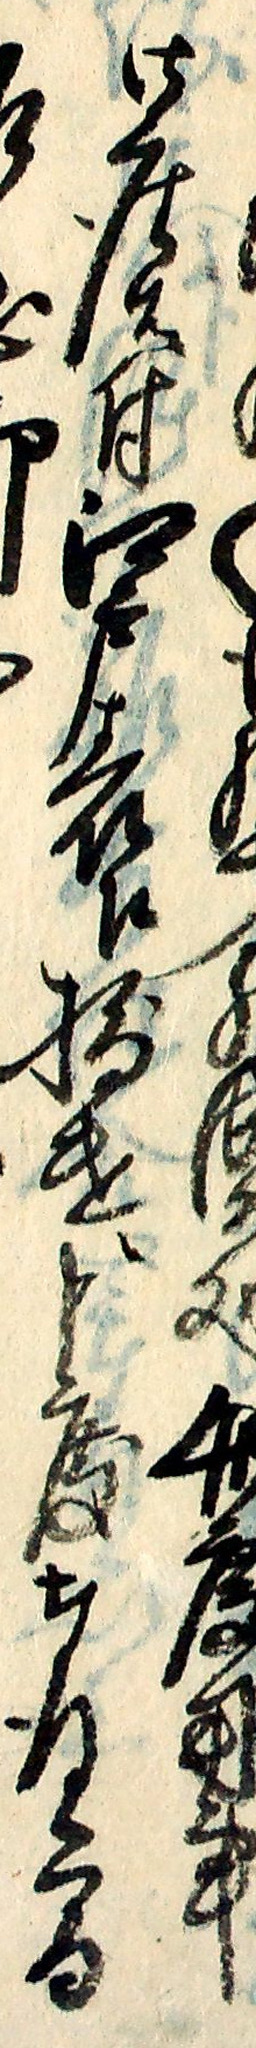御座候に付江戸表え指遣し申度奉存候間
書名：諸御願書控(後藤氏壱番）
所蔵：鳴門教育大学 Naruto University of Education
